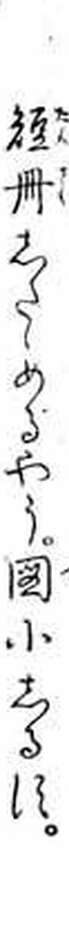短冊したゝめるやう。図にしるす。
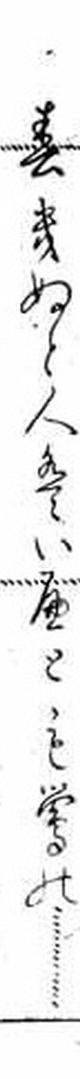春始春きぬと人はいへとも鴬の
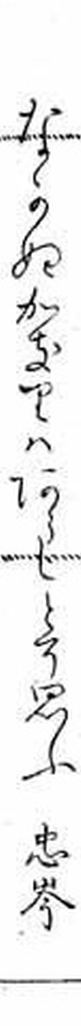なかぬかきりはあらじとそ思ふ忠岑
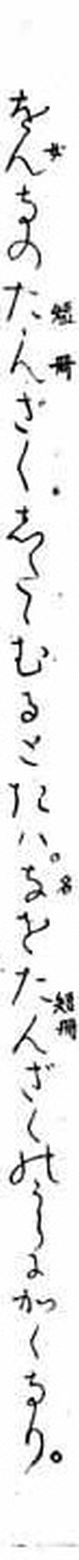をんなのたんざく。したゝむるときは。なをたんざのうらにかくなり。
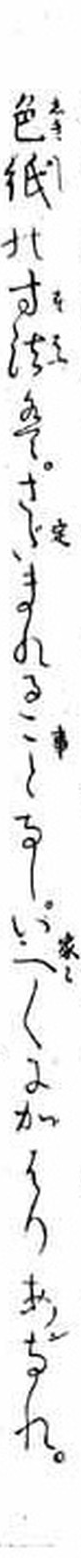色紙の寸法は。さだまれることなし。いへ〳〵にかはりあなれ。
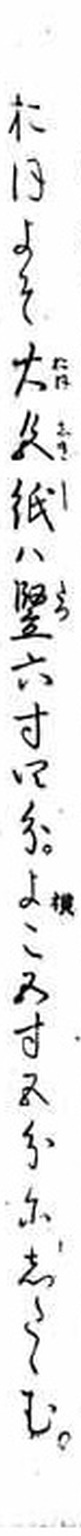おほよそ大色紙は竪六寸四分。よこ五寸五分にしたゝむ。
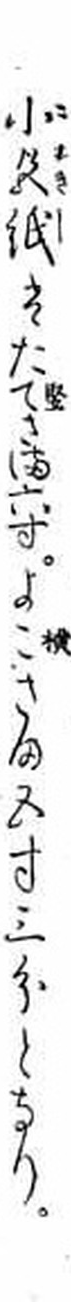小色紙はたてさま六寸。よこさま五寸三分となり。
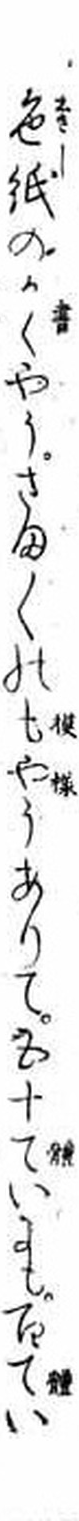色紙のかくやう。さま〳〵のもやうありて。五十ていも。百てい
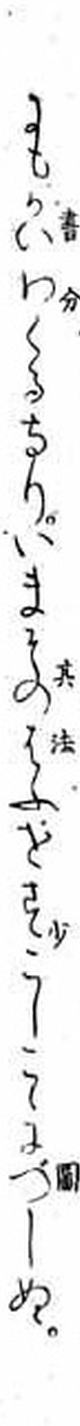にも会わくるなり。いまそのはふをすこしこゝにづしぬ
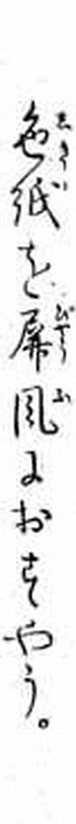色紙を屏風におすやう。
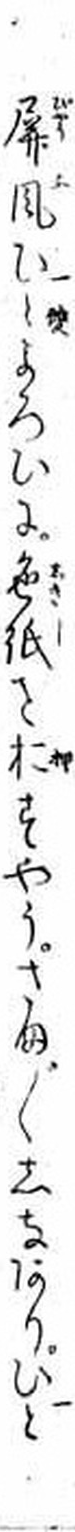屏風ひとよろひに。色紙をおすやう。さま〴〵しなあり。ひと
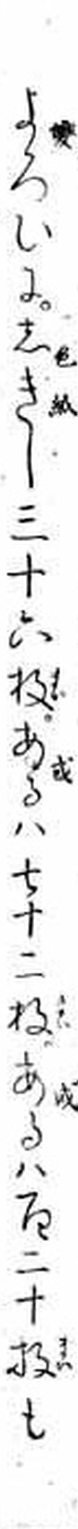よろひに。しきし三十六枚。あるは七十二枚。あるは百二十枚も
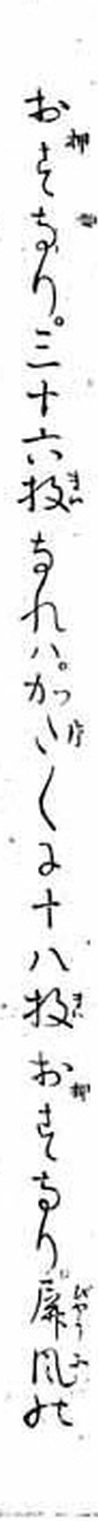おすなり。三十六枚なれは。かた〳〵に十八枚おすなり。屏風の

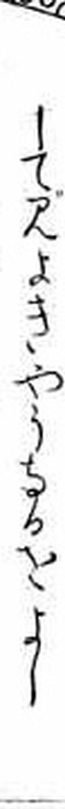二して。見よきやうなるをよし
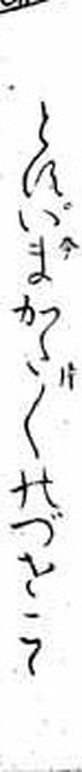三とす。いまかた〳〵のづをこゝ
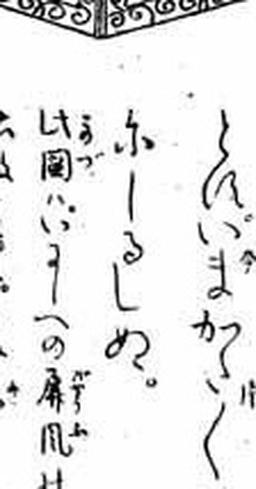四にしるしぬ。
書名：女学範
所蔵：東京学芸大学教育コンテンツアーカイブ
